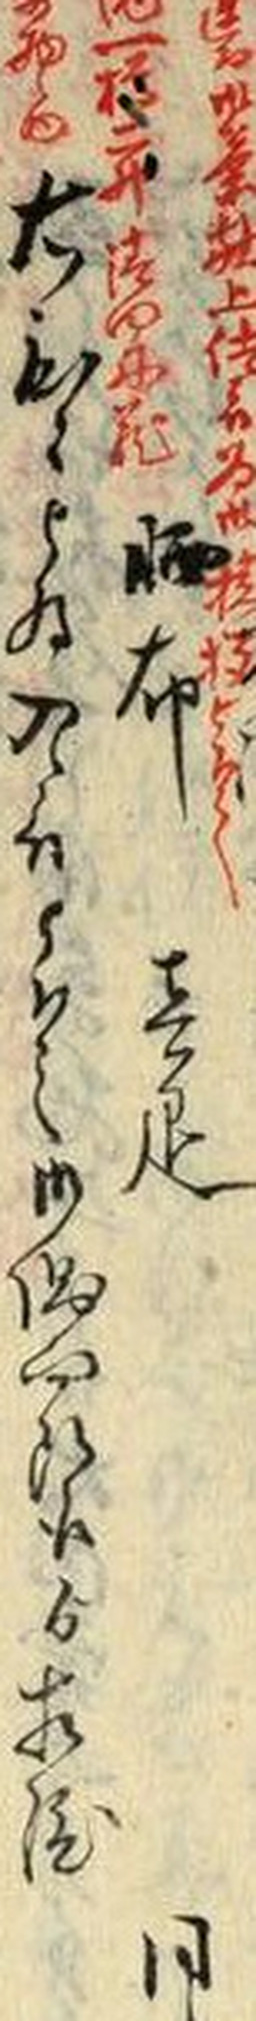右度々被為入候ニ付被下之御側向頭取ゟ相渡
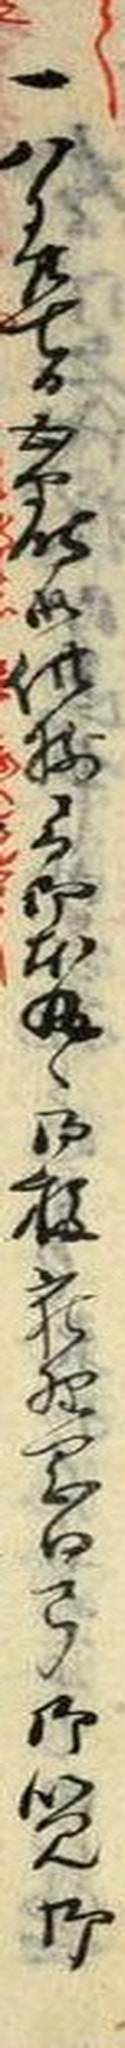一八月廿七日五半時御供揃ニ而御本丸へ御移荻野岡田弓御覧御
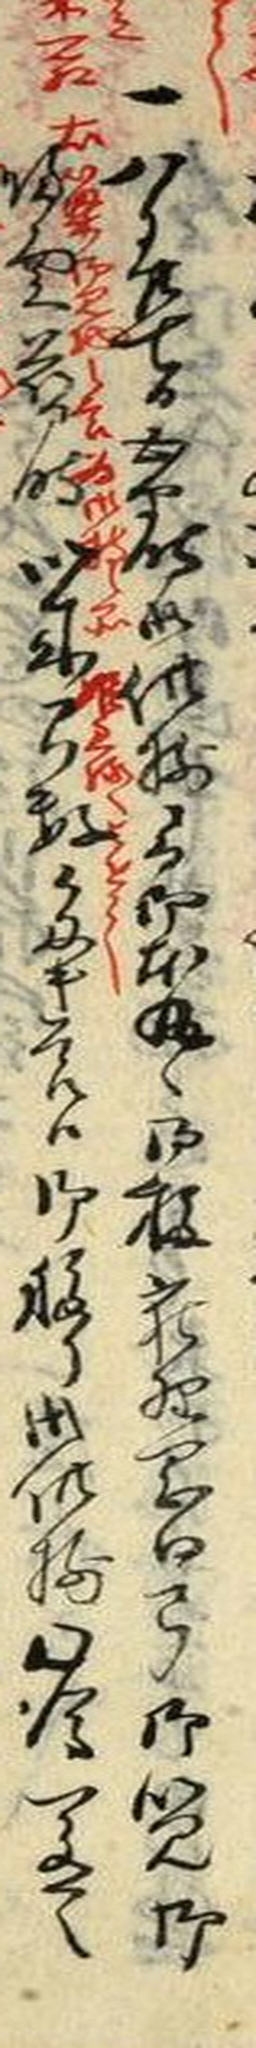帰殿暮時以来弓数多キ節ハ御移り御供揃心得可有之

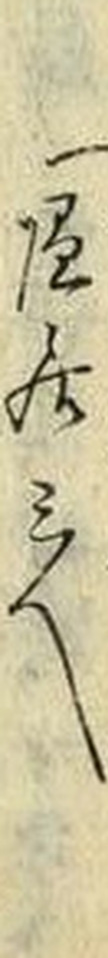隠居三人
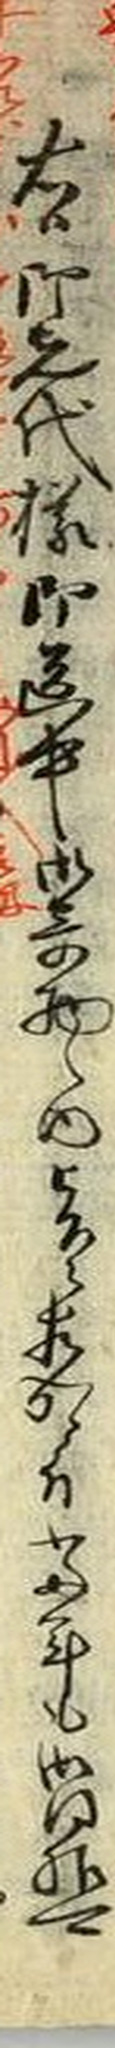右ハ御先代様御道中御奇物之内被下ニ相成候ニ付当年も御同様可
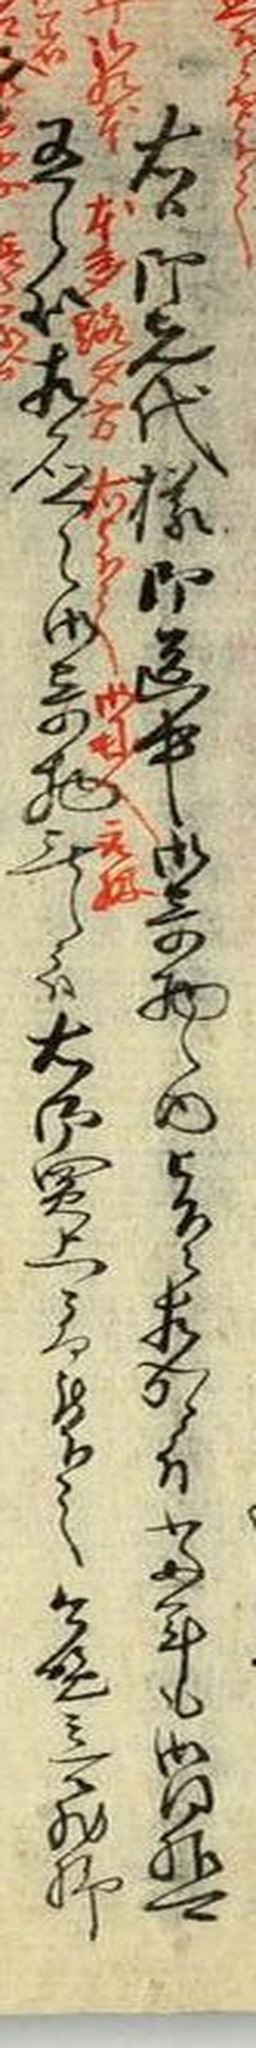有之処相応之御奇物無之ニ付右御買上ニ而被下之今晩立飛脚
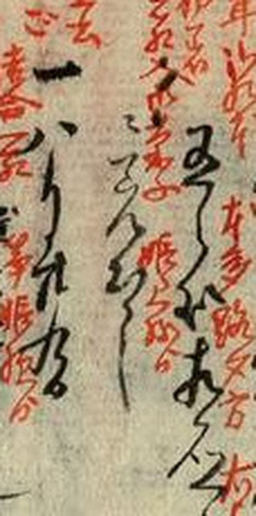ニ差出之
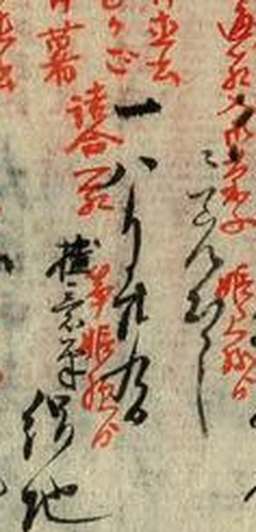一八月廿九日
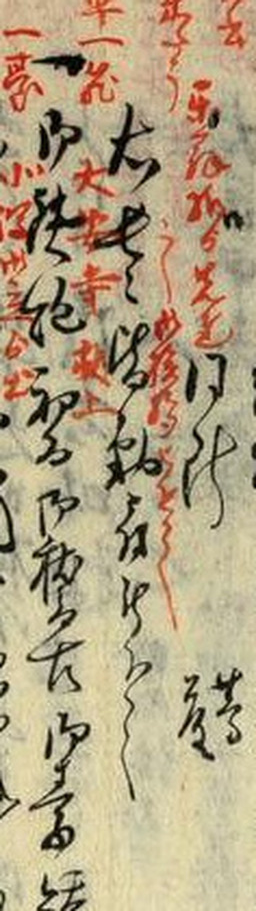右長々皆勤ニ付被下之
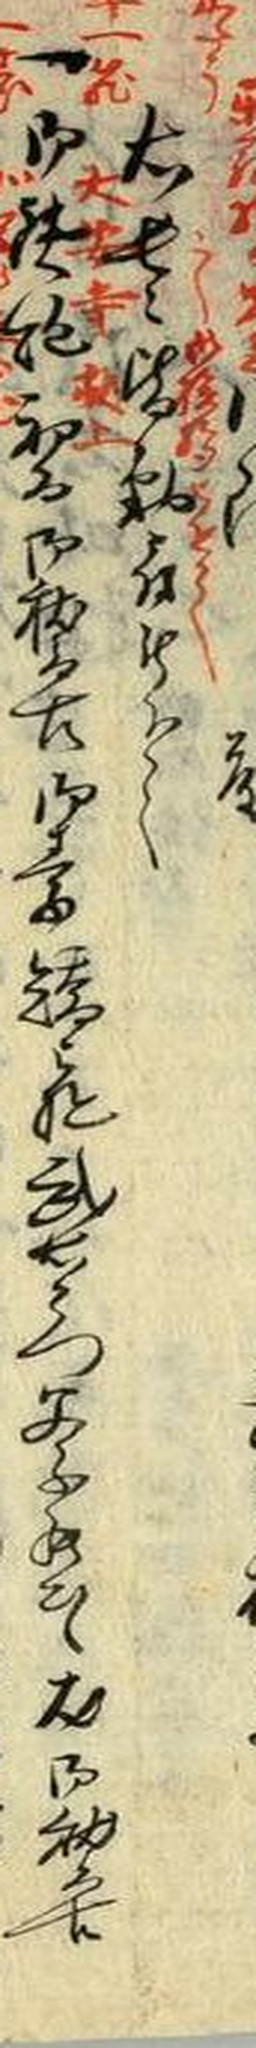一御鉄炮初而御稽古御素矯被遊武右衛門父子罷出候尤御稽古
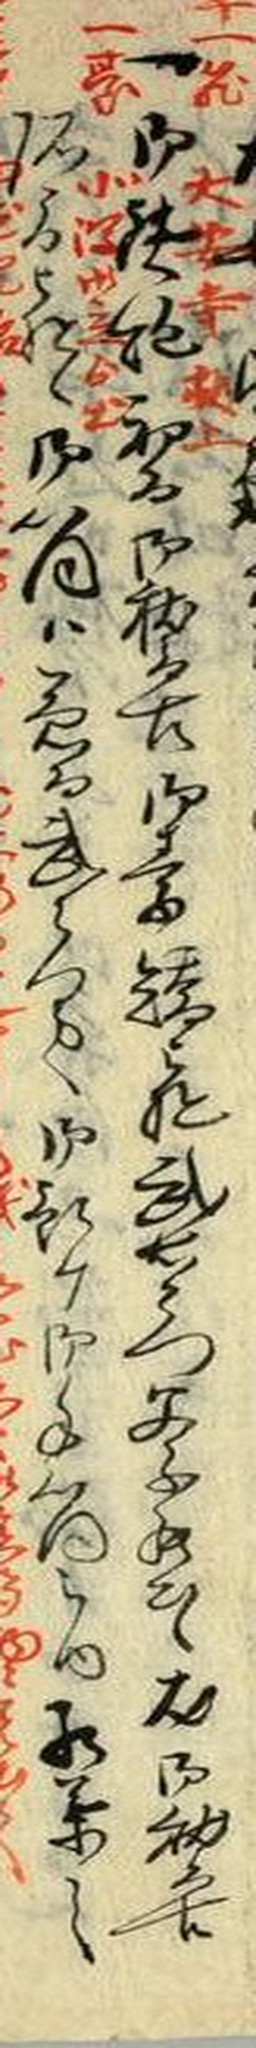所ニ而被遊候御筒ハ兼而武右衛門方へ御預ケ御手筒之内紅葉之
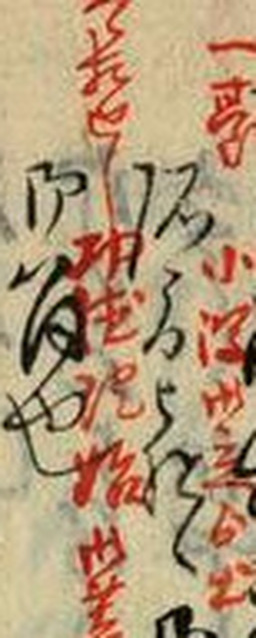御筒也
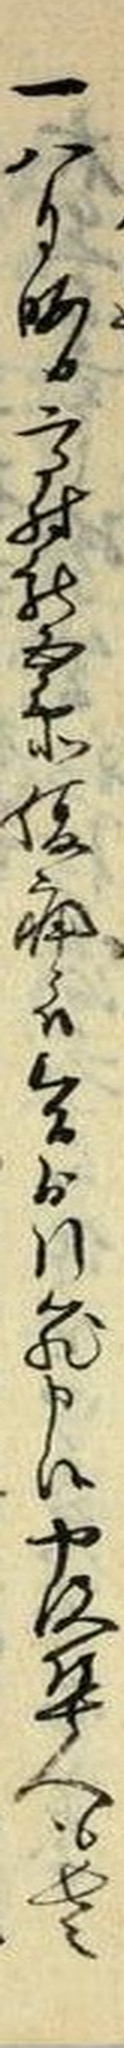一八月晦日高村新五兵衛腹痛ニ付今日ゟ引籠申候中沢隼人も長々
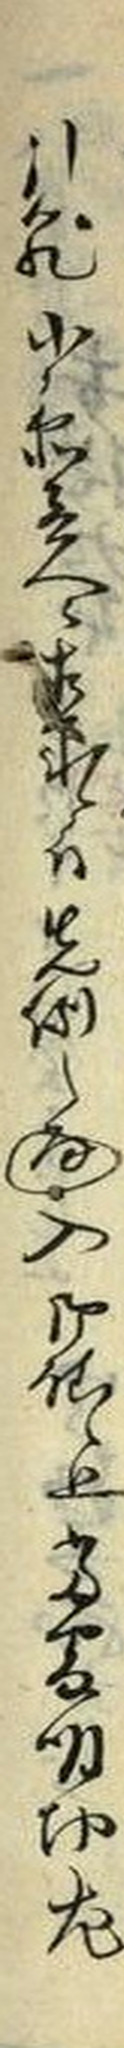引籠小兵衛壱人ニ相成候ニ付先例之通入御聴候上当番明切尤
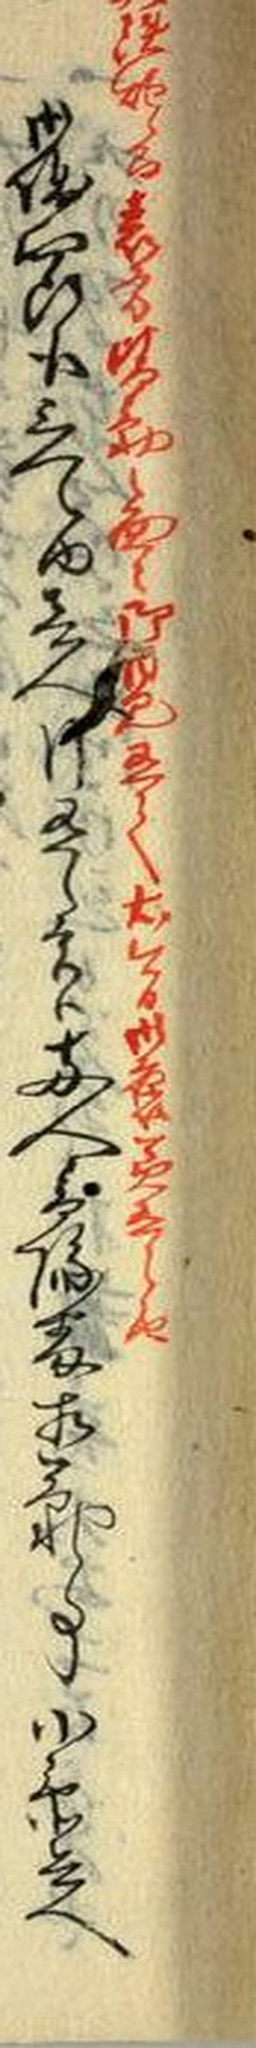御側向頭取三人之内壱人引有之節ハ両人ニ而隔番相勤候事小兵衛壱人
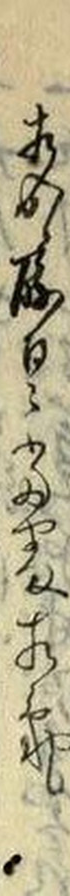相成隔日ニ当番相勤候
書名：少傅日録抄（斉承付側向頭取日記、在国）
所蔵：福井県文書館 Fukui Prefectural Archives
